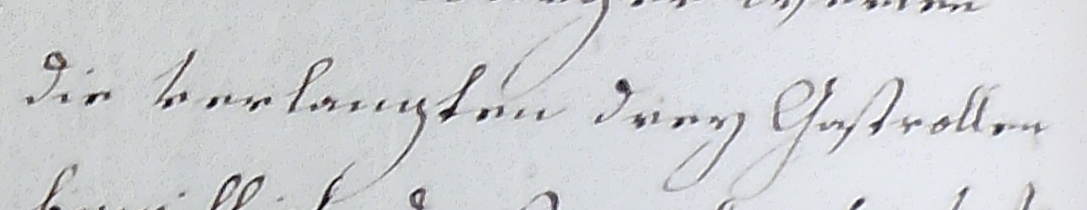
die verlangten drey Gastrollen
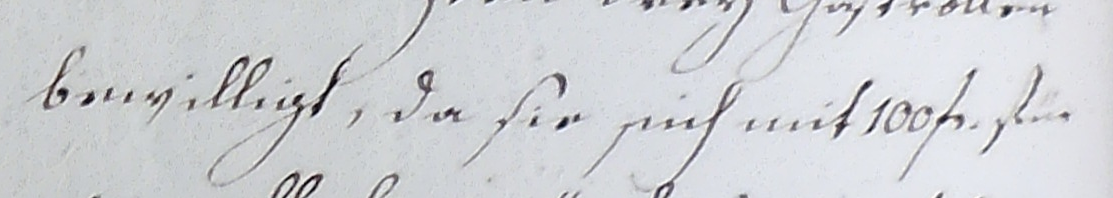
bewilligt, da sie sich mt 100fr für
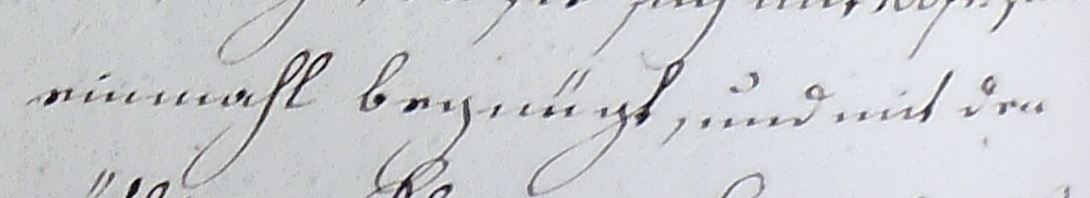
einmahl begnügt, und mit den
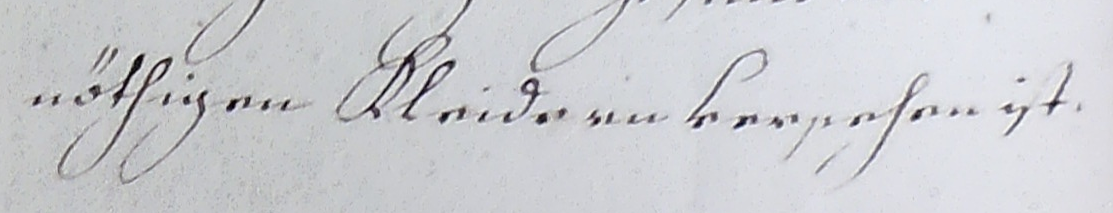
nöthigen Kleidern versehen ist.
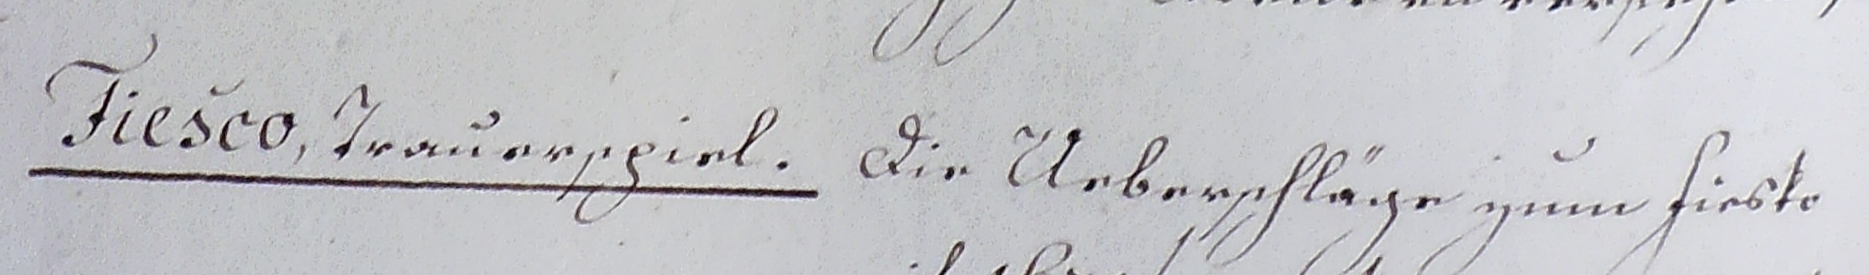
Fiesco, Trauerspiel. Die Ueberschläge zum Fiesko
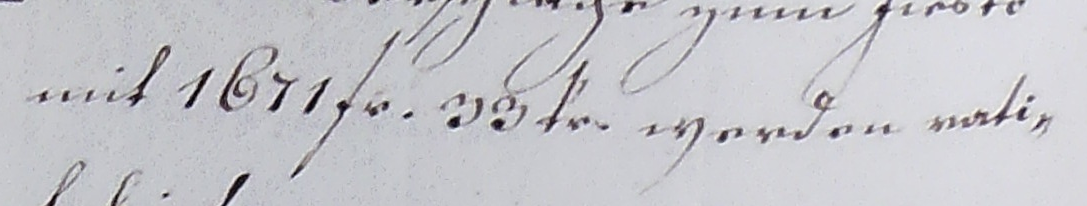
mit 1671fr. 33kr. werden rati¬
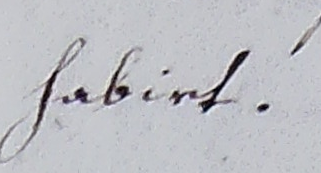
habirt.
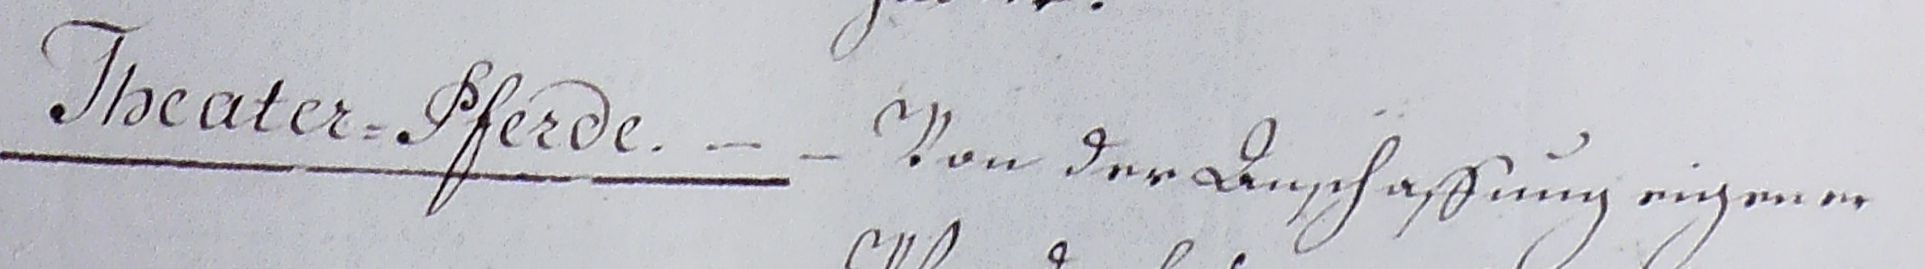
Theater‗ Pferde. .. .. Von der Anschaffung eigener
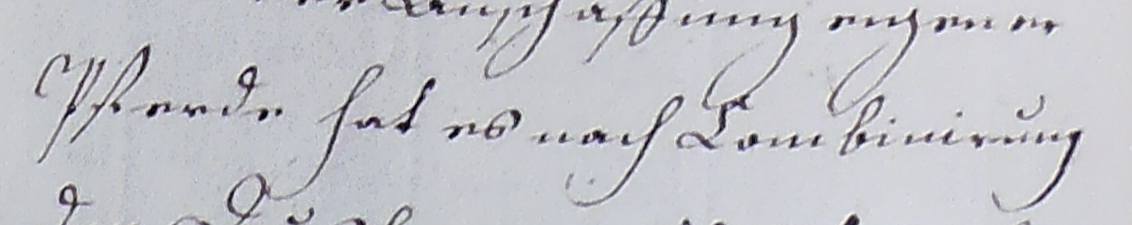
Pferde hat es nach Combinirung
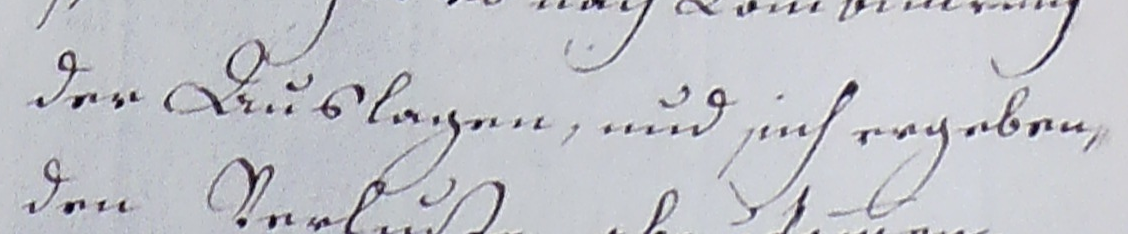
der Auslagen, und sich ergeben,
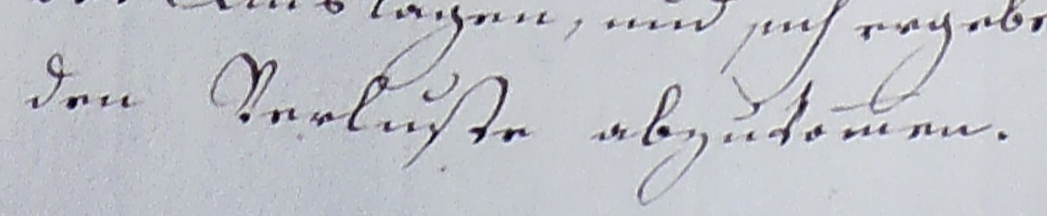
den Verluste abzukom̅en.
